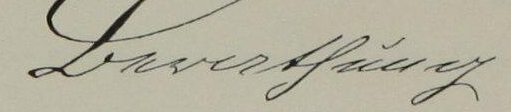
Berathung
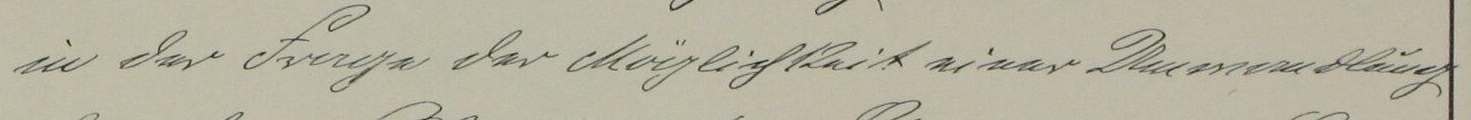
in der Frage der Möglichkeit einer Umwandlung
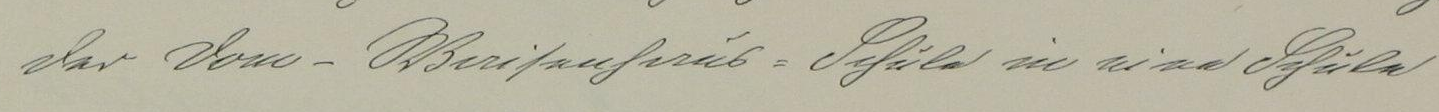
der Dom-Waisenhaus-Schule in eine Schule
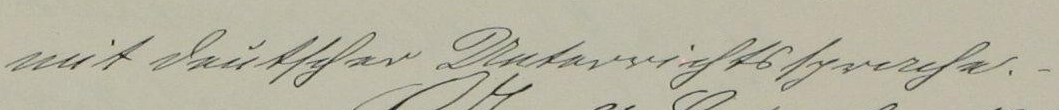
mit deutscher Unterrichtssprache.
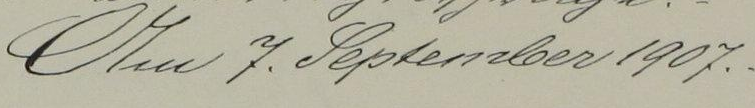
Am 7. September 1907.
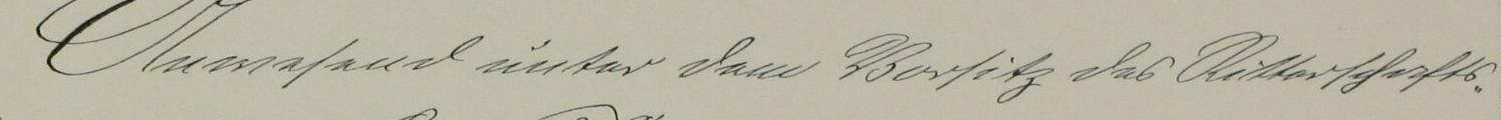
Anwesend unter dem Vorsitz des Ritterschafts-
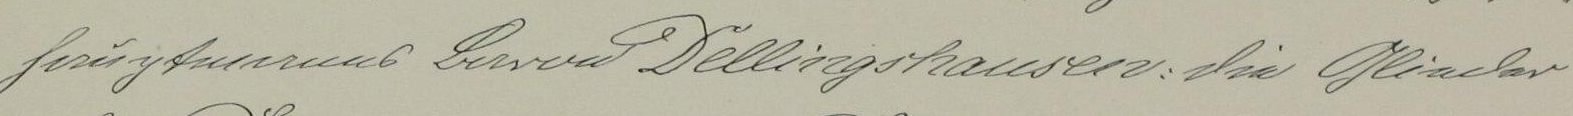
hauptmanns Baron Dellingshausen: die Glieder
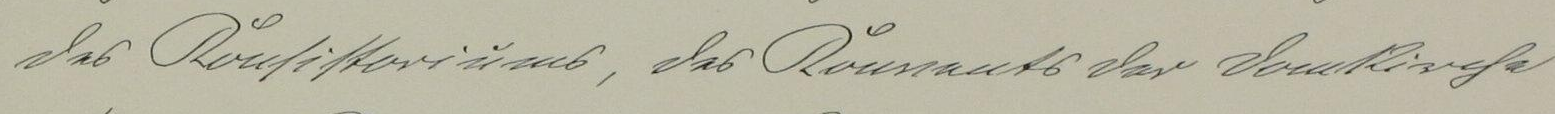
des Konsistoriums, des Konvents der Domkirche
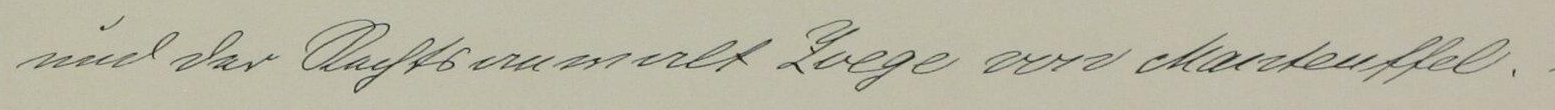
und der Rechtsanwalt Zoege von Manteuffel.
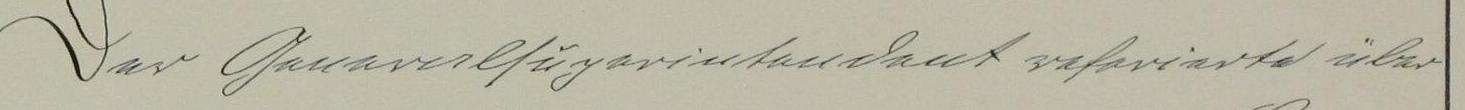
Der Generalsuperintendent referierte über
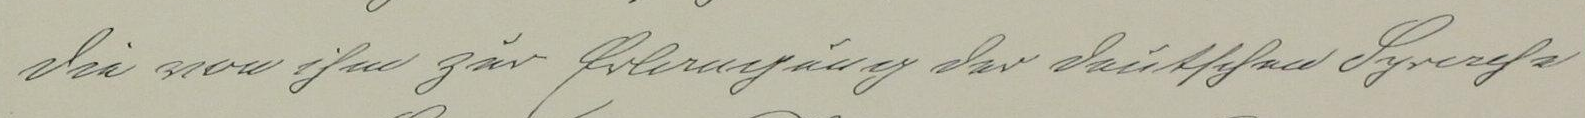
die von ihm zur Erlangung der deutschen Sprache
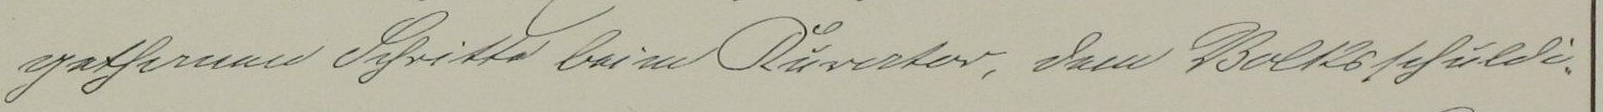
gethanen Schritte beim Kurator, dem Volksschuldi-
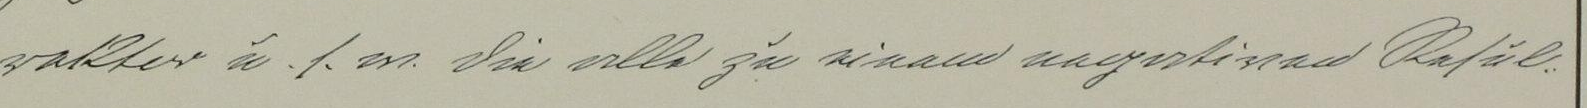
rektor u.s.w. die alle zu einem negativen Resul-
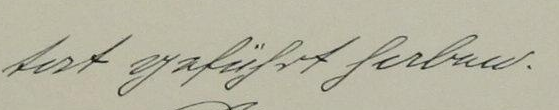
tat geführt haben.
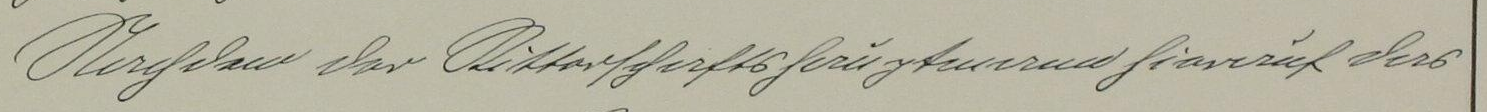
Nachdem der Ritterschaftshauptmann hierauf das
